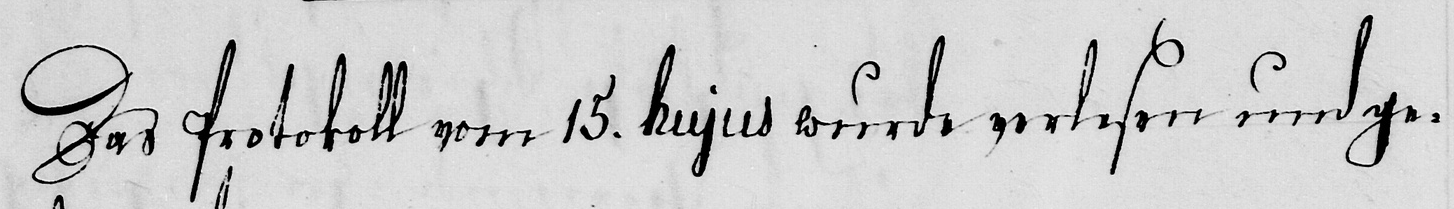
Das Protokoll vom 15. hujus wurde verlesen und ge¬
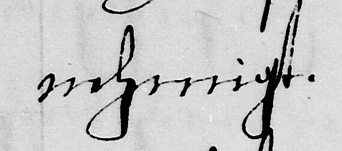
nehmigt.
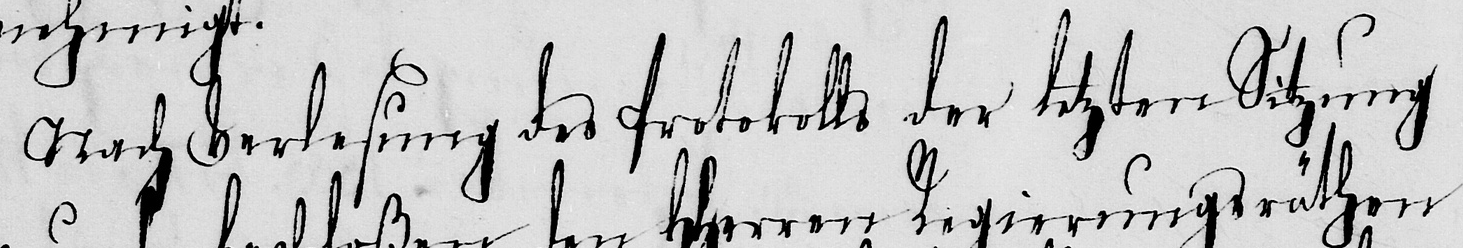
Nach Verlesung des Protokolls der letzten Sitzung
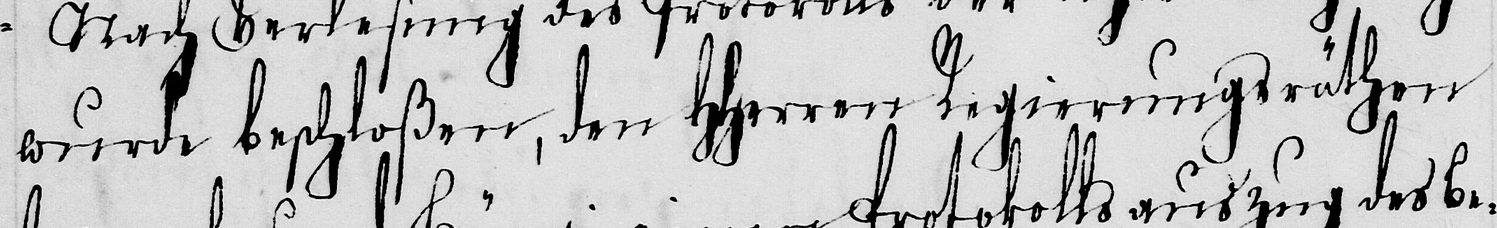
wurde beschloßen, den HHerren Regierungsräthen
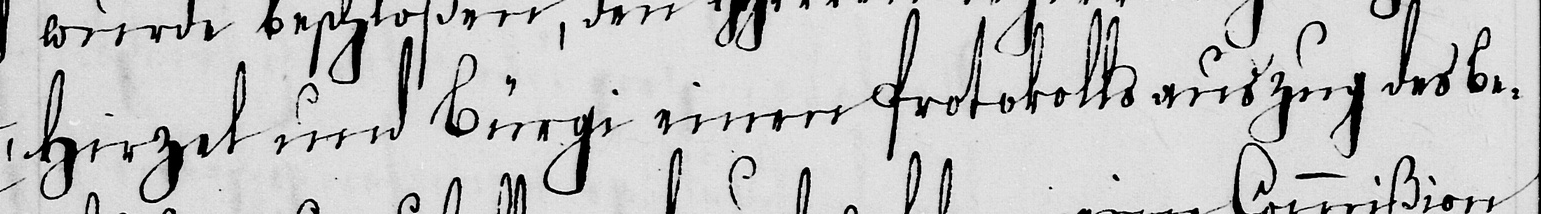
Hirzel und Bürgi einen Protokollsauszug des Be¬
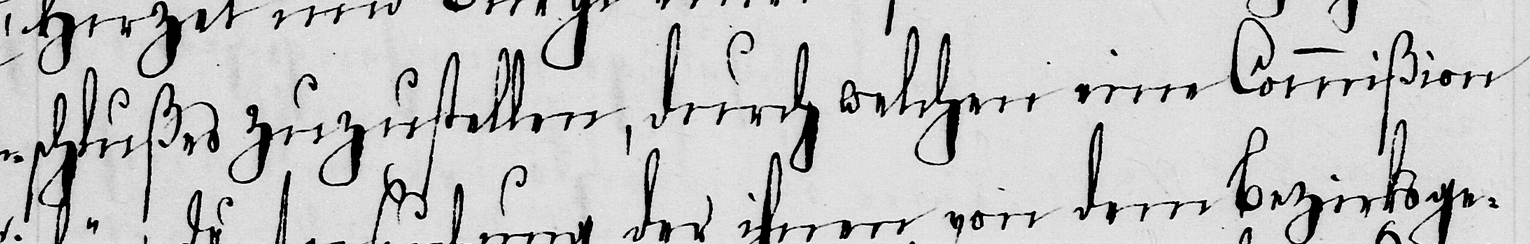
schlußes zuzustellen, durch welchen eine Commißion
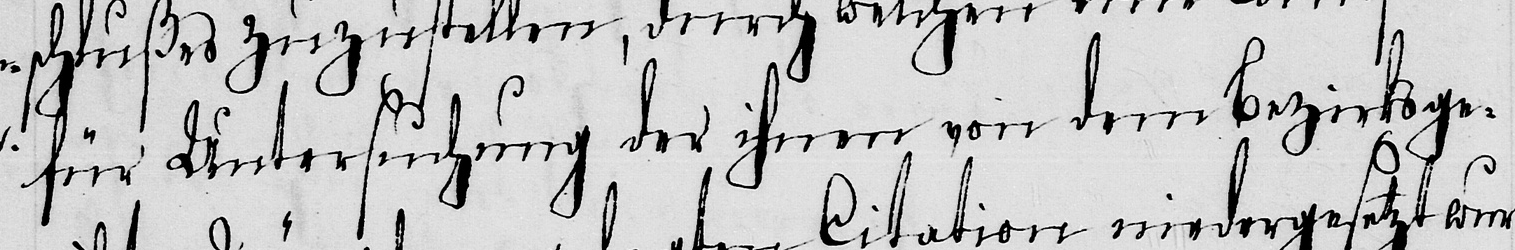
für Untersuchung der ihnen von dem Bezirksge¬
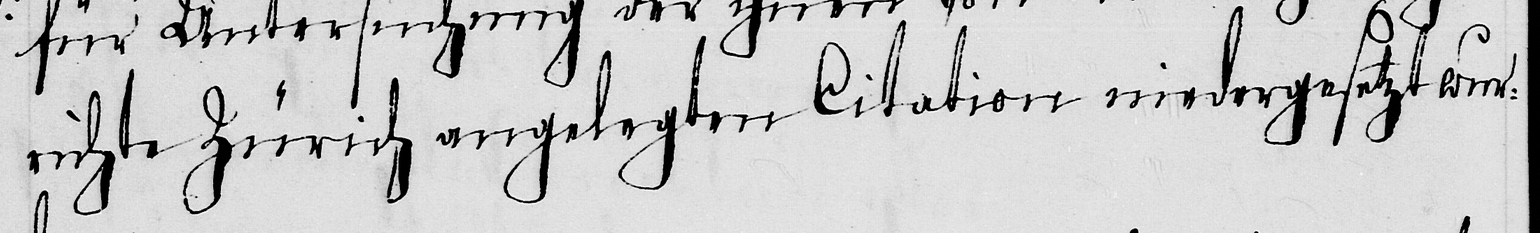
richte Zürich angelegten Citation niedergesetzt wur¬
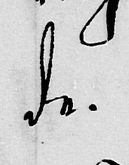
de.
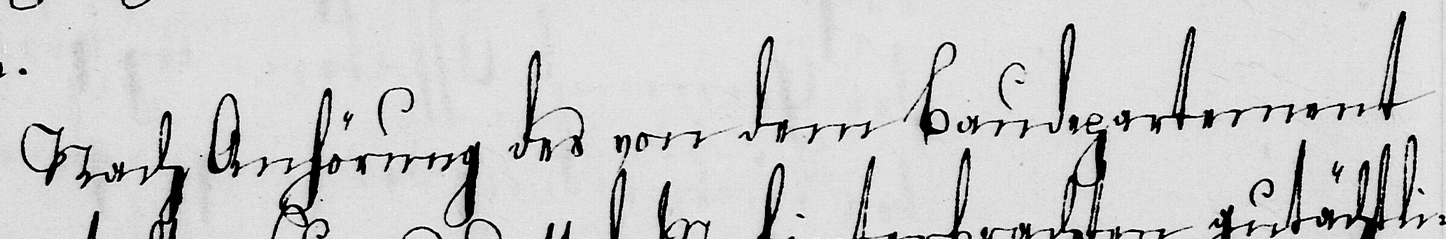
Nach Anhörung des von dem Baudepartement
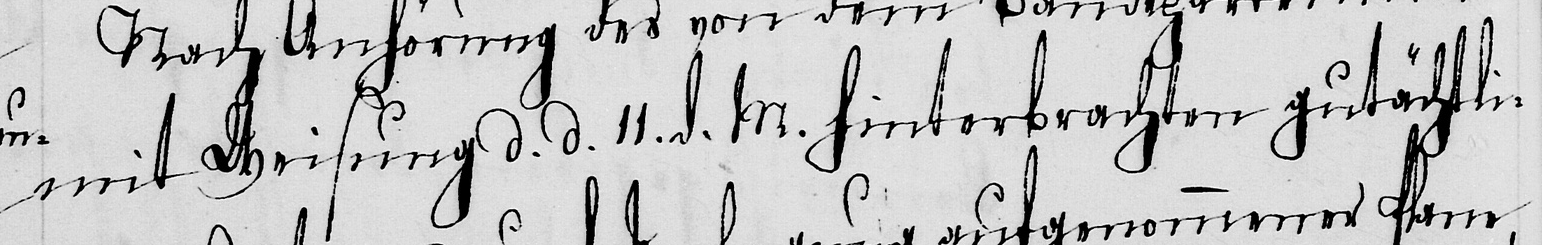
mit Weisung d. d. 11. d. M. hinterbrachten gutächtli¬
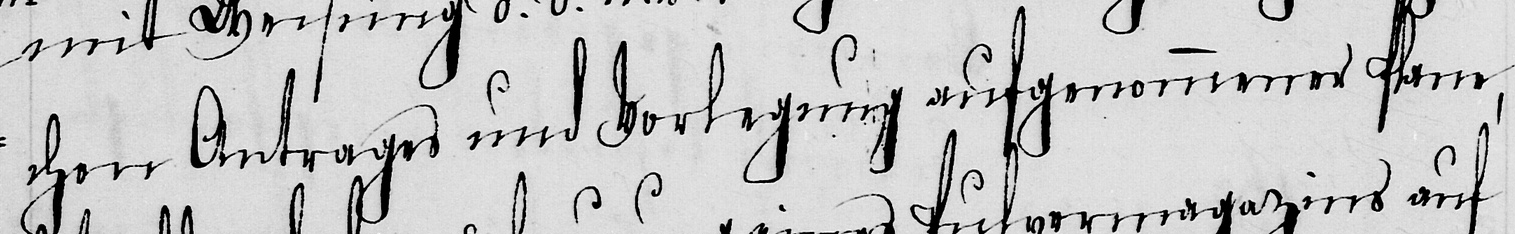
chen Antrages und Vorlegung aufgenommener Plane
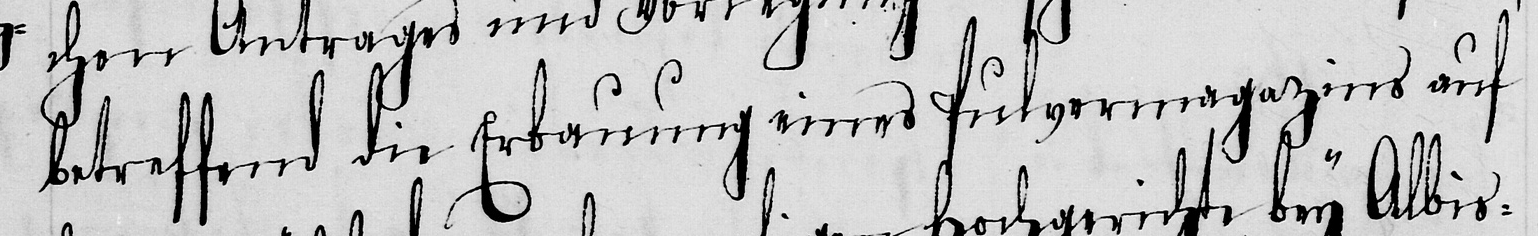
betreffend die Erbauung eines Pulvermagazins auf
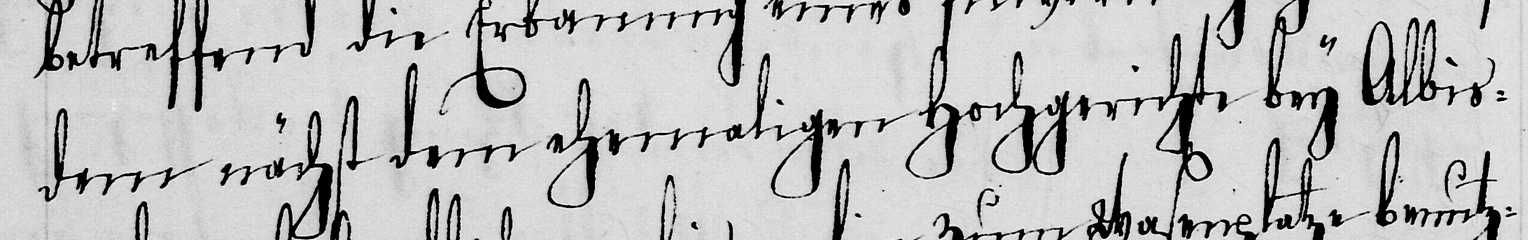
dem nächst dem ehemaligen Hochgerichte bey Albis¬
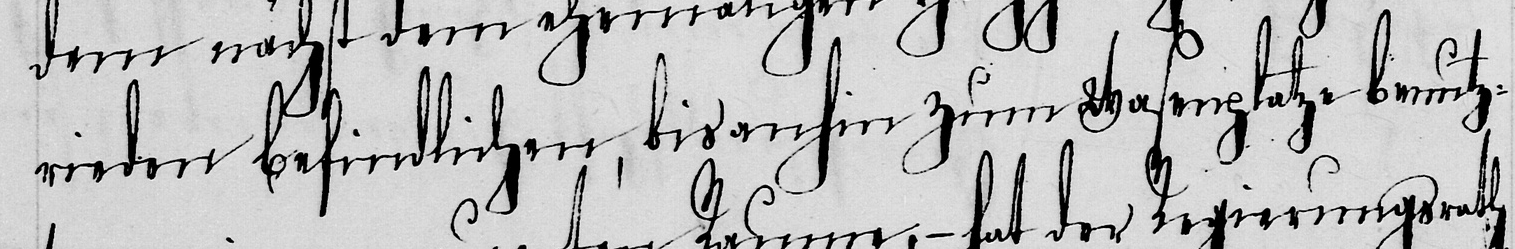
rieden befindlichen, bisanhin zum Wasenplatze ben¬
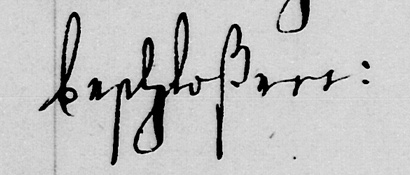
beschloßen:
